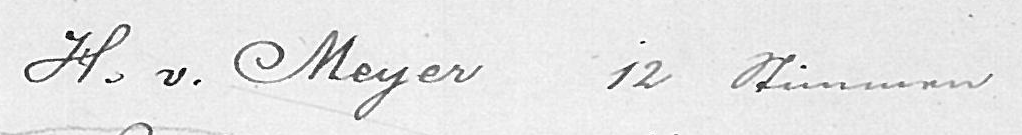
H. v. Meyer 12 Stimmen
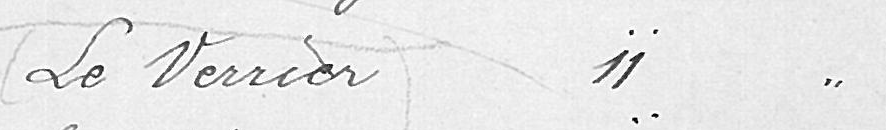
Le Verrier 11 "
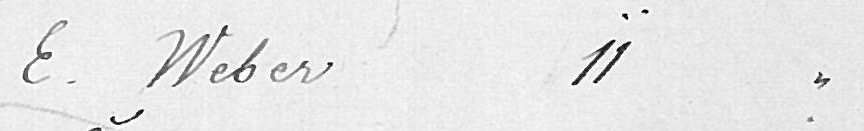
E. Weber 11 "
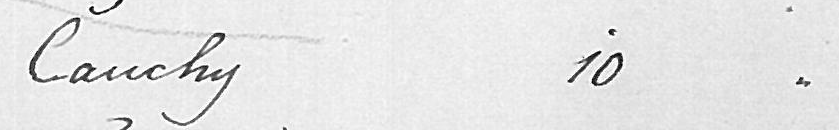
Cauchy 10 "
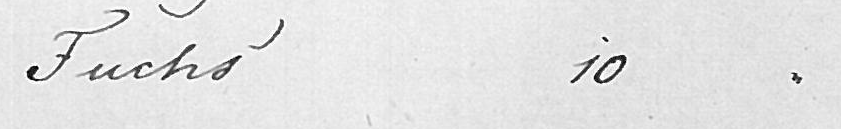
Fuchs 10 "
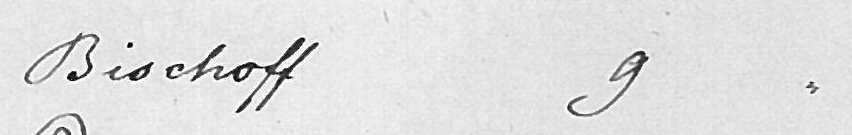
Bischoff 9 "
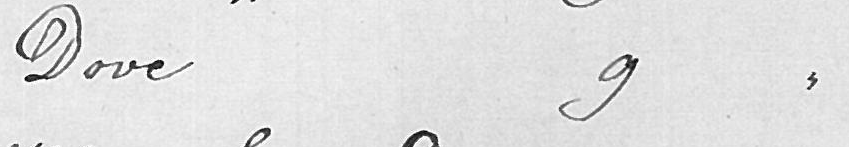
Dove 9 "
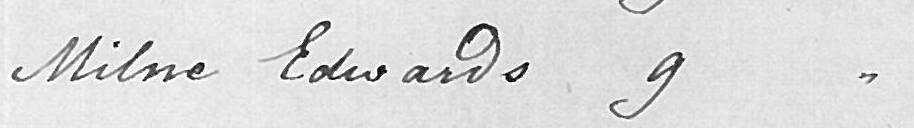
Milne Edwards 9 "
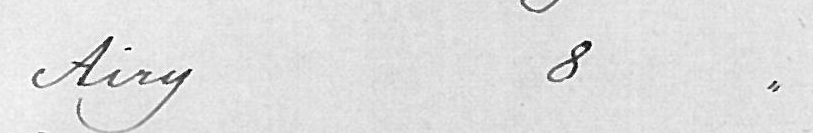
Airy 8 "
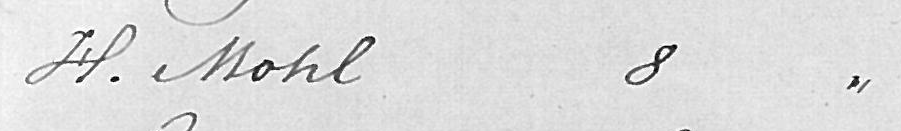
H. Mohl 8 "
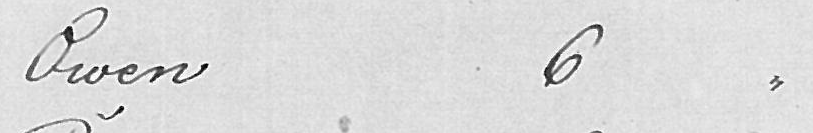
Owen 6 "
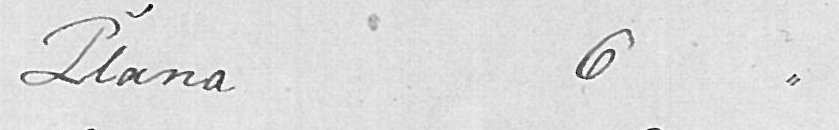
Plana 6 "
